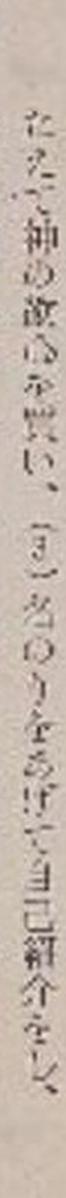たえて神の歓心を買い、(３)名のりをあげて自己紹介をし、
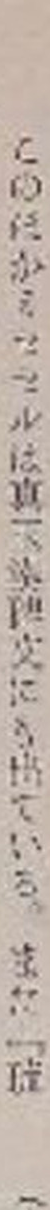このほかミセセルは真玉湊碑文にも出ている。また『琉
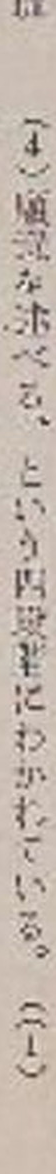(４)願意を述べる、という四にわかれている。((１)
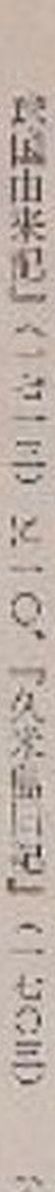球国由来記』(一七一三)に一〇、『久米島日記』(一七〇三)
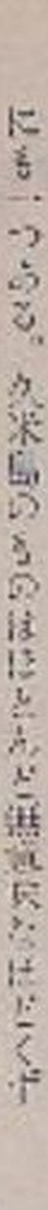にも一つある。久米島のものはほとんど無意味なほどくず
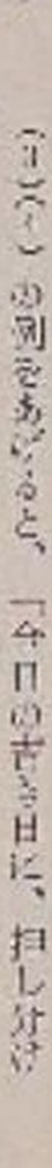(３)(４)の例をあげると、「今日の吉き日に、押し分け
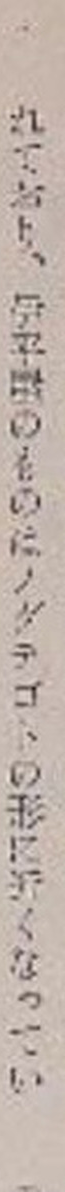れており、伊平屋のものはノダテゴトの形に近くなってい
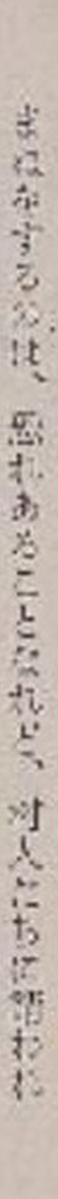まねをするのは、恐れあることなれど、村人たちに請われ
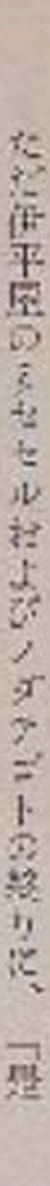ただ伊平屋のミセセルおよびノダテゴトの終りに、「是
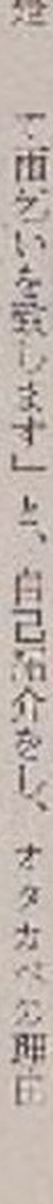て雨乞いを致します」と、自己紹介をし、オタカベの理由
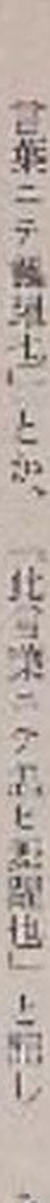言葉ニテ也」とか、「此言葉ニテ謡ヒ躍也」と記し
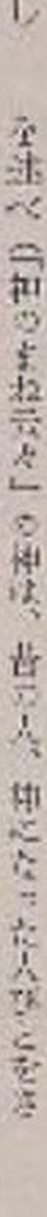を述べ(「神のまね云々」の神は、昔の人、神になった人びとをさ
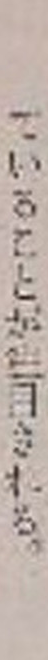ていることが注目される。
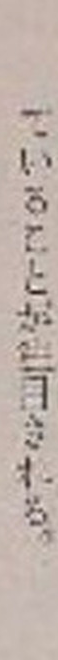ていることが注目される。
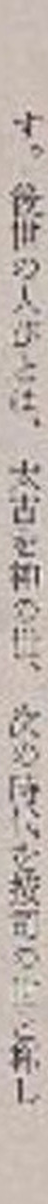す。後世の人びとは、太古を神の世、次の時代を按司の世と称し
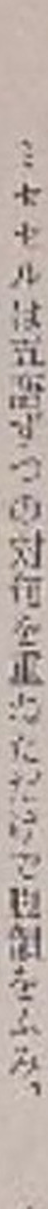ミセセルは五語ずつの対句を重ねただけで韻をふみ、
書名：沖縄口承文芸
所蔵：University of the Ryukyus Library
